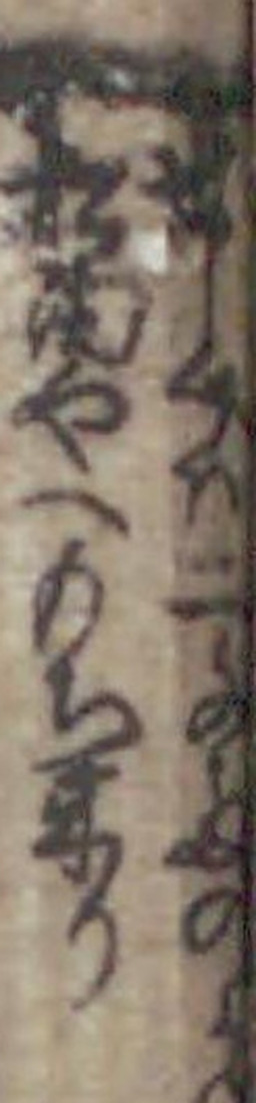松浦やへもち来り
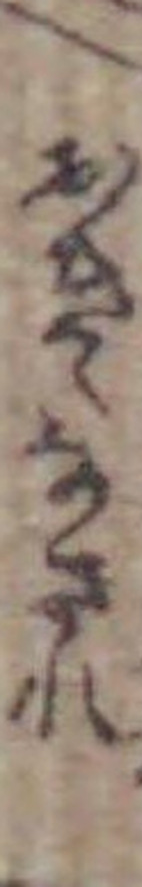おきゝなされ
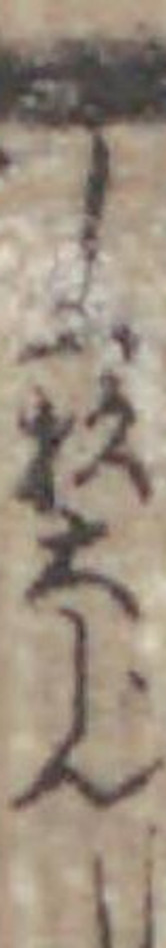しに杉大じん
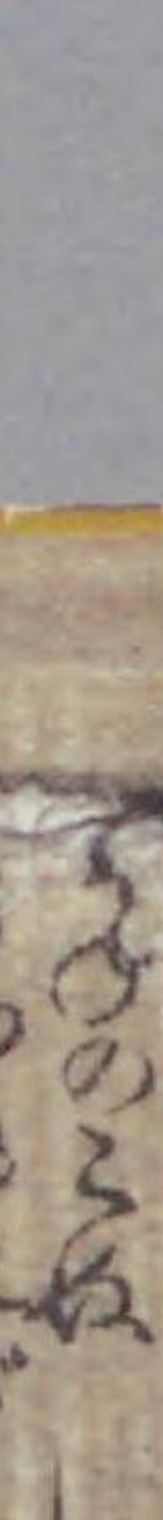かねのこぬ
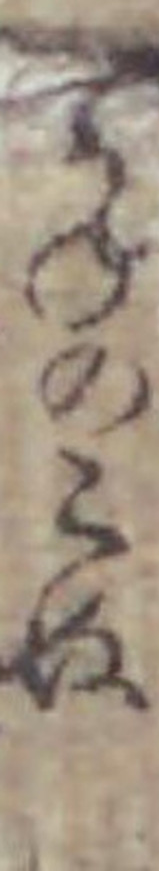かねのこぬ
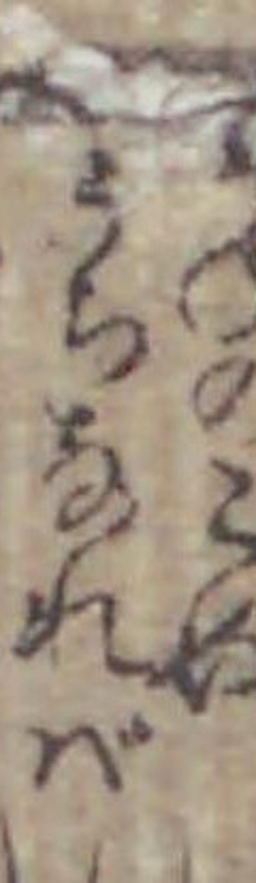うちなれば
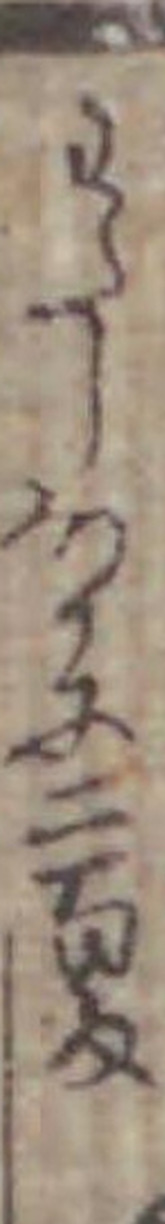わたしほかに二百両
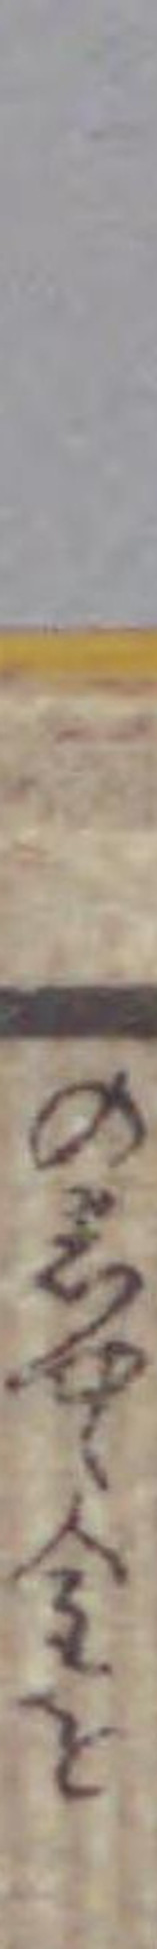のしやく金を
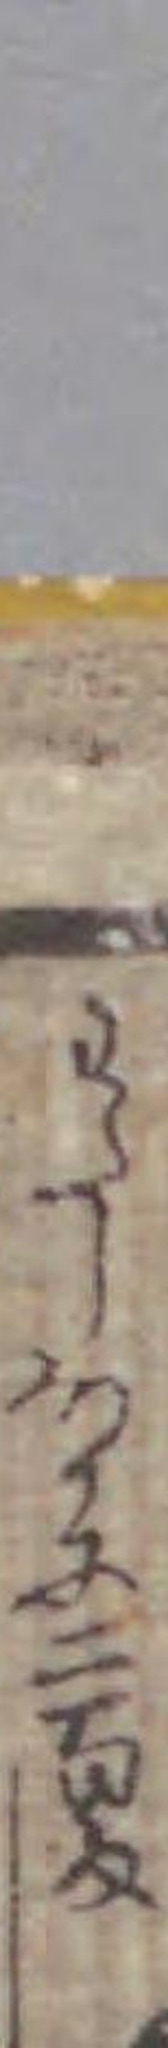わたしほかに二百両
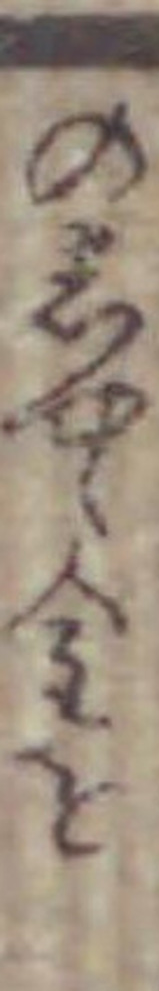のしやく金を
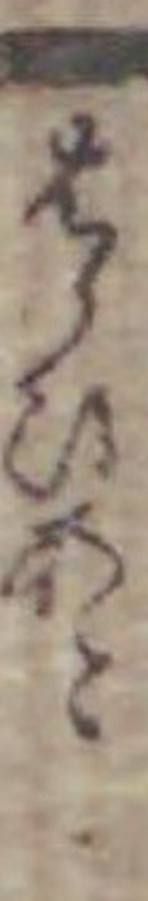はらひあと
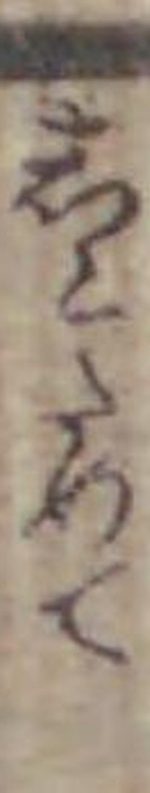志とためて
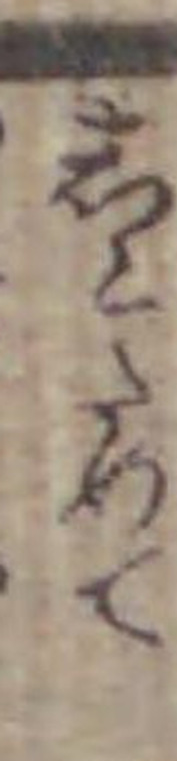志とためて
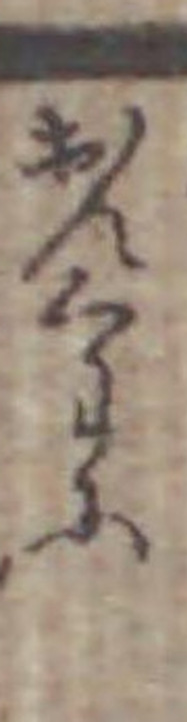おんくわふ
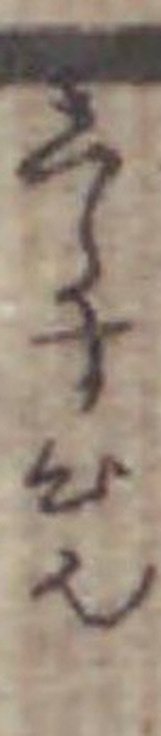くらす心也
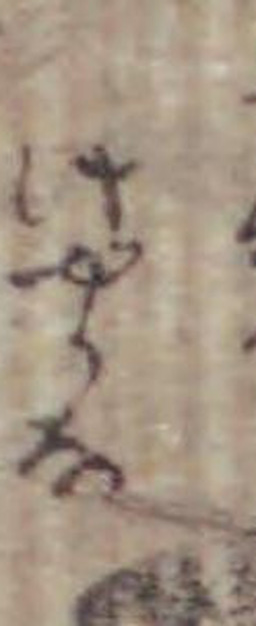此やうな
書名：嗚呼不侭世之助噺 : 3巻
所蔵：国立国会図書館 National Diet Library, JAPAN
